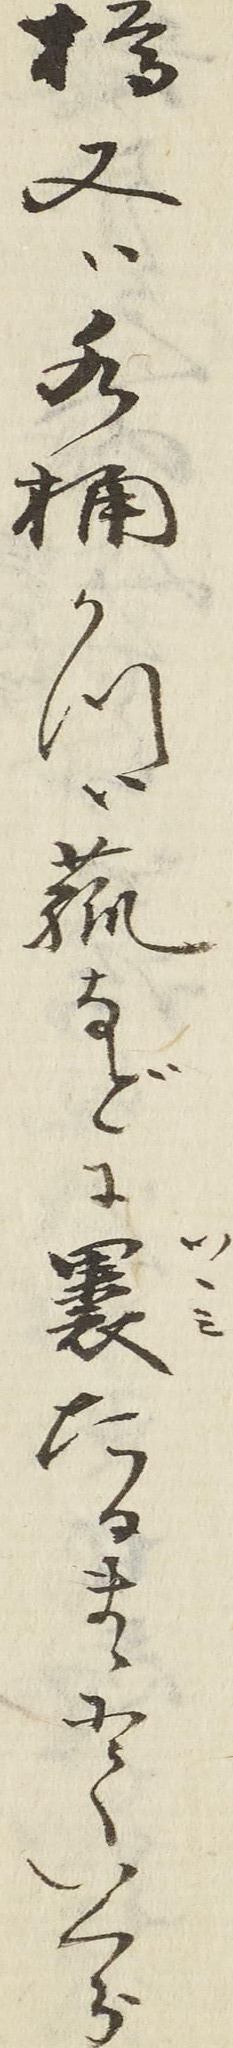樽又は水桶かつは蔬などに裹たるまゝにていくら
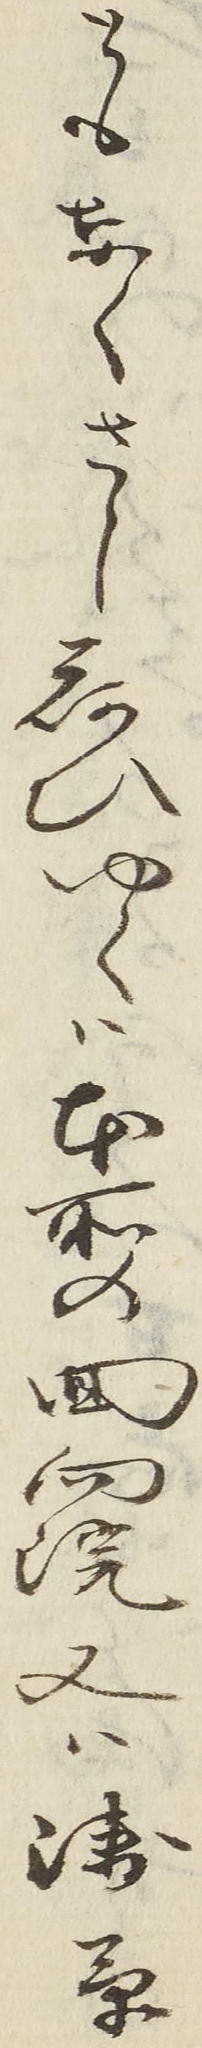ともなくさし荷ひゆく本所の回向院又は浅草
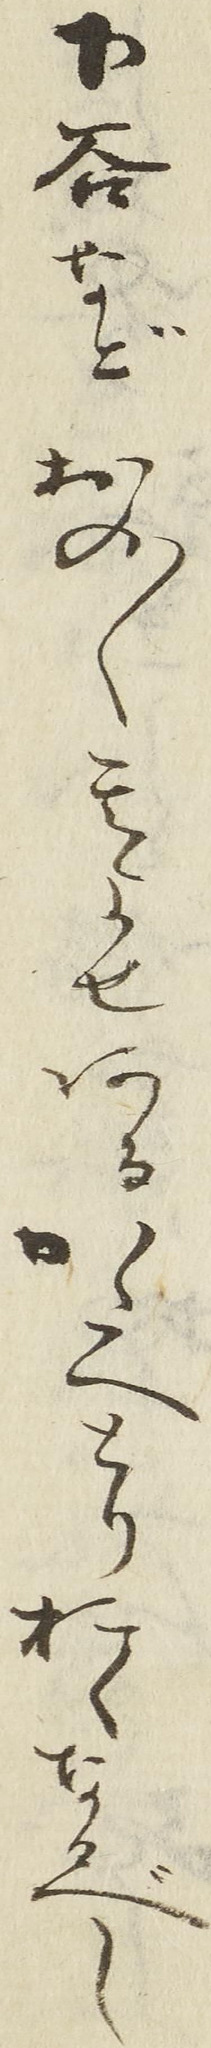下谷などおの〳〵其よせあるかたへとりおくなるべし
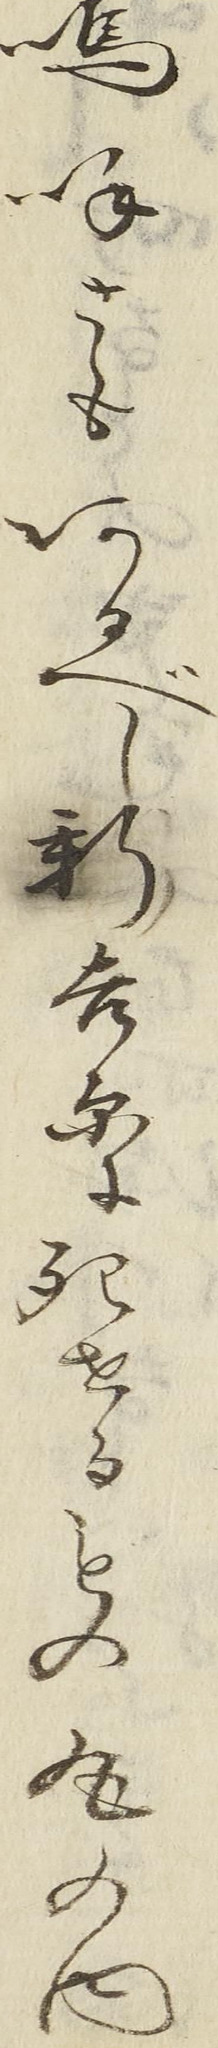嗚呼さもあるべし新吉原に死せるもの丸の内

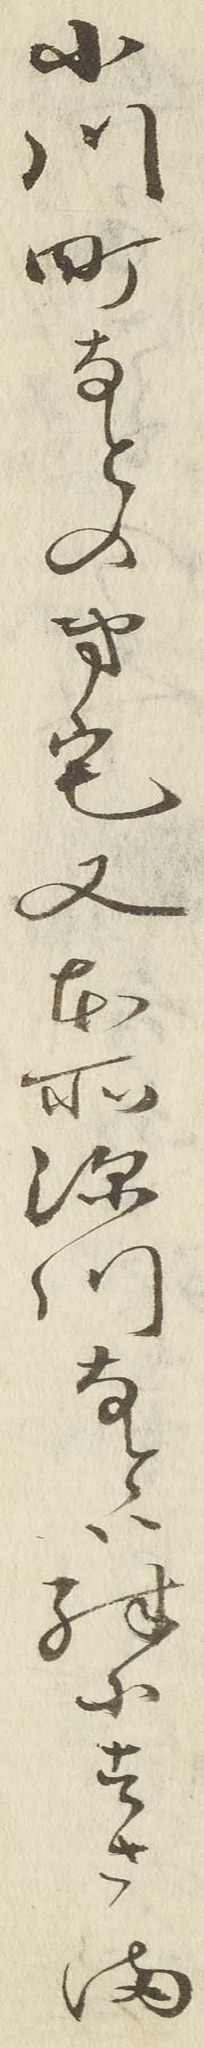小川町なとの第宅又本所深川なとは殊にすさま
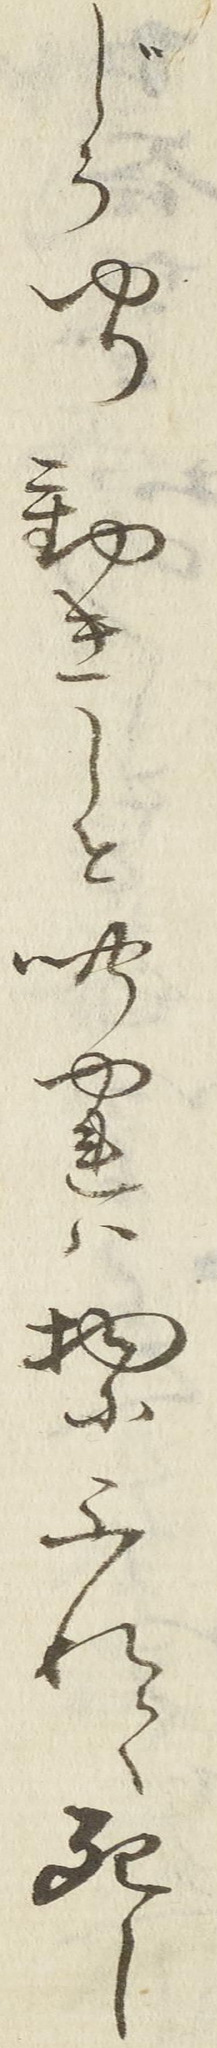じうゆり動きしと聞ゆれは物にふれて死し
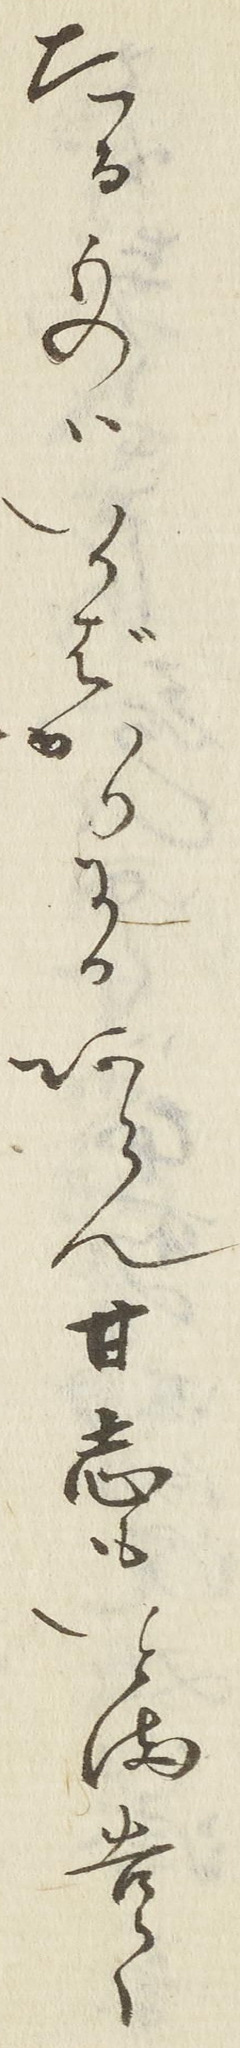たるものはいかばかりにかあらん甘志もいとま告て
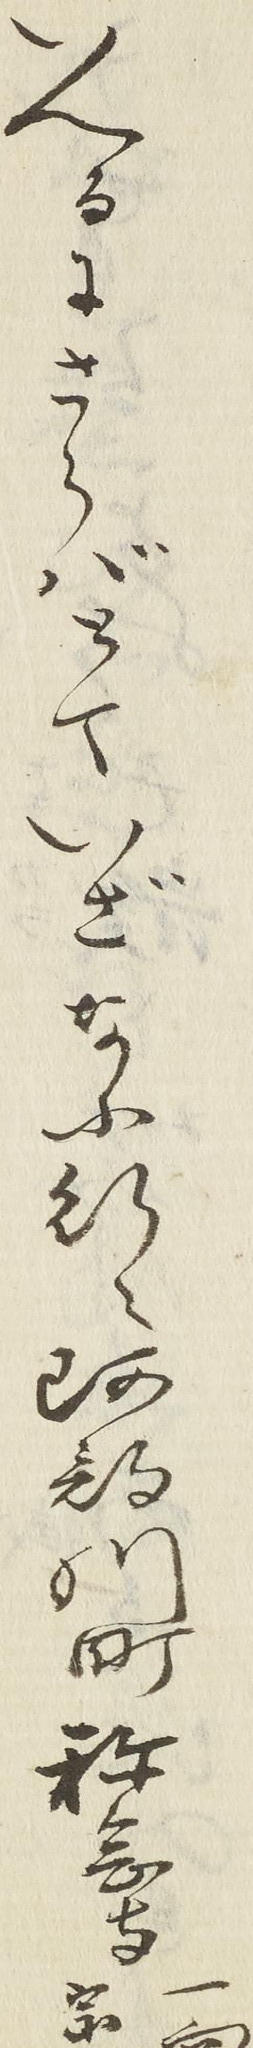いへるにさらばとていざなふ行〻阿部川町称念寺一向宗
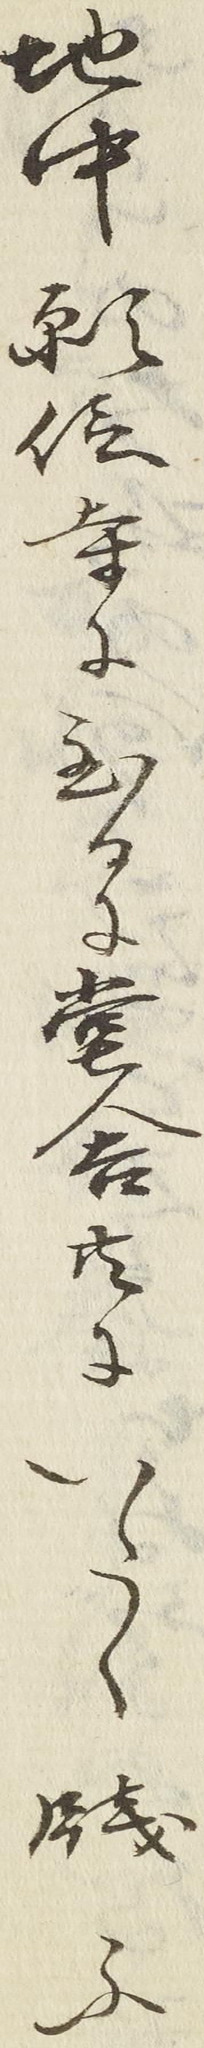地中願信寺に至るに堂舎共にいたく牋ふ
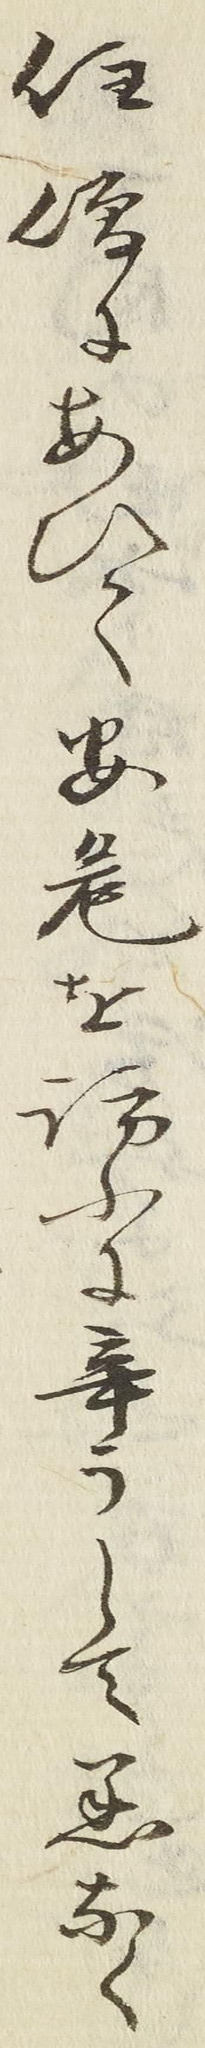住僧にあひて安危を訪ふに辛うして恙なく
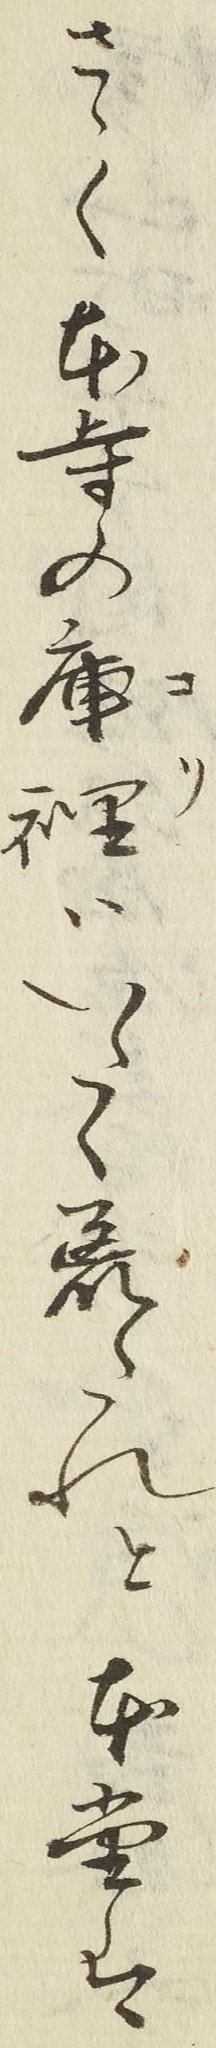さゝく本寺の庫裡はいたく荒たれと本堂は
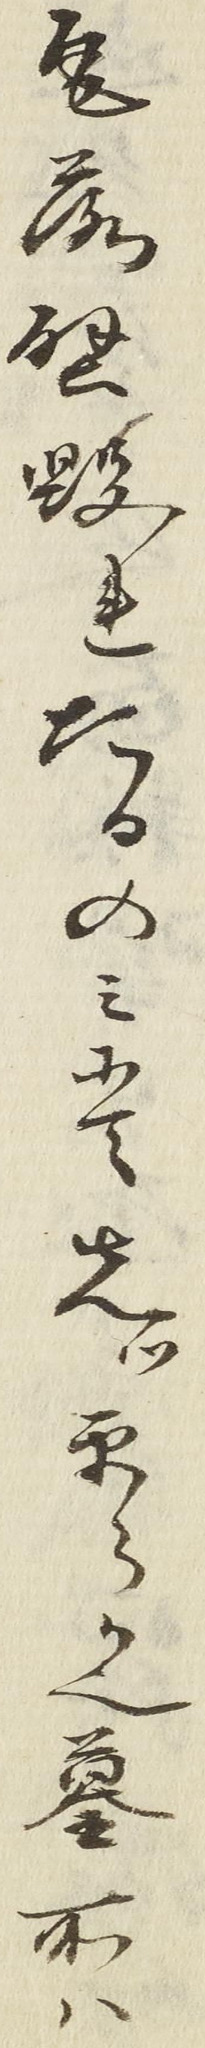瓦落壁毀れたるのみにて先つ平らか也墓所は
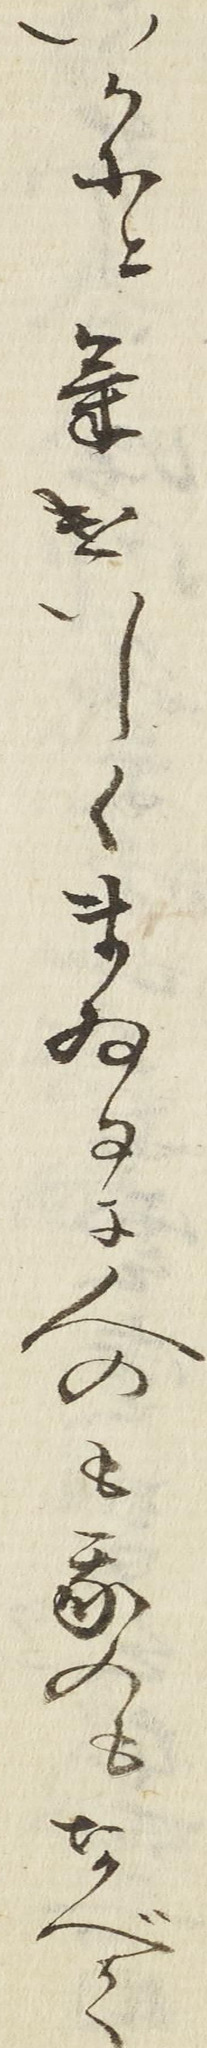いかにと気遣いしくまゐるに人のも我のもなべて
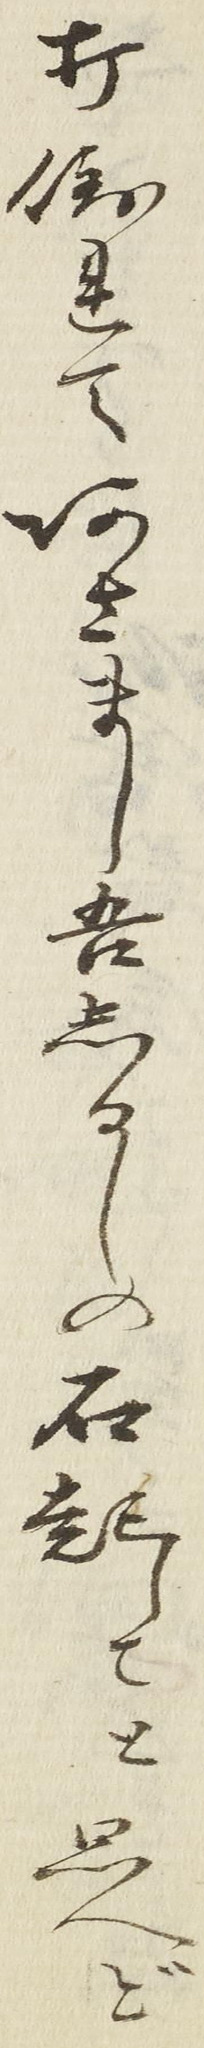打倒れてあさまし吾しるしの石起こしてと思へど
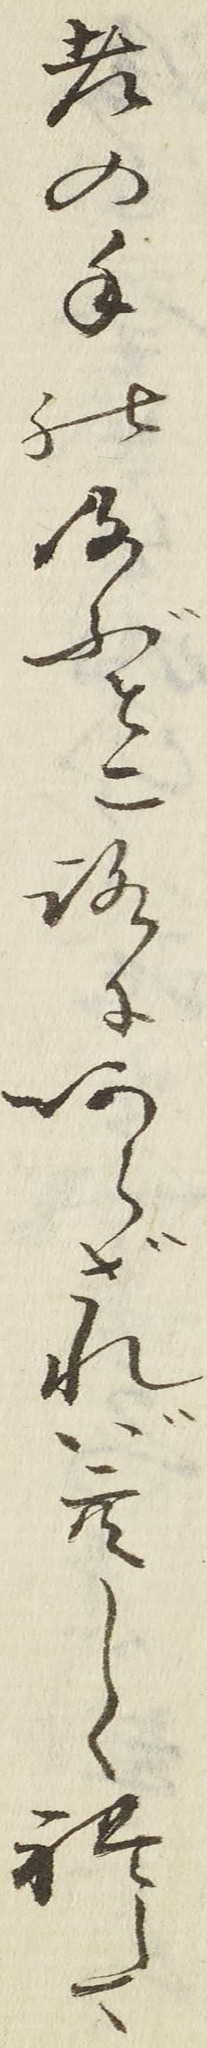老の手の及ぶところにあらざれば空しく礼して
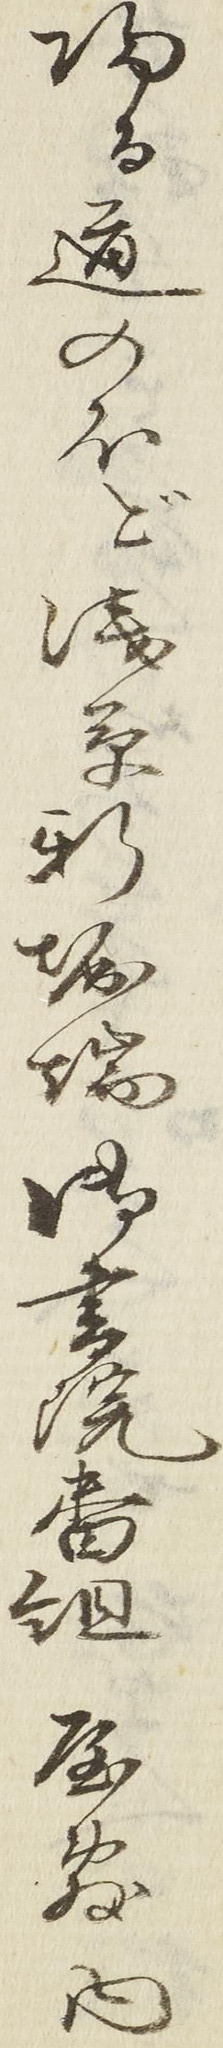帰る道のほど浅草新堀端御書院番組屋敷内
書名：やぶれ窓の記　全
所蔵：東京大学地震研究所図書室 Earthquake Research Institute Library, The University of Tokyo, JAPAN
